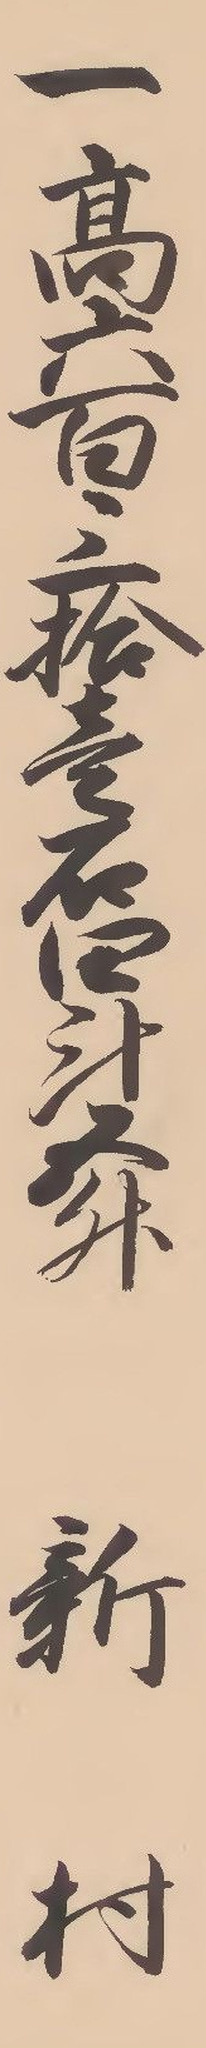一高六百三拾壱石四斗五升新村
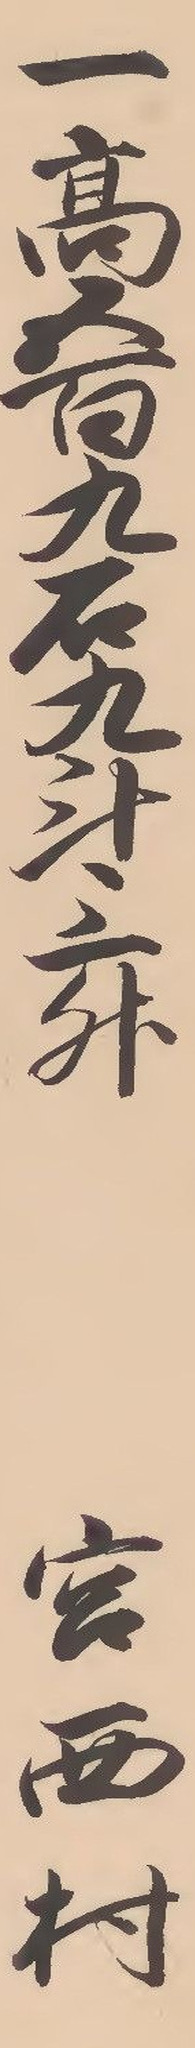一高五百九石九斗三升宮西村
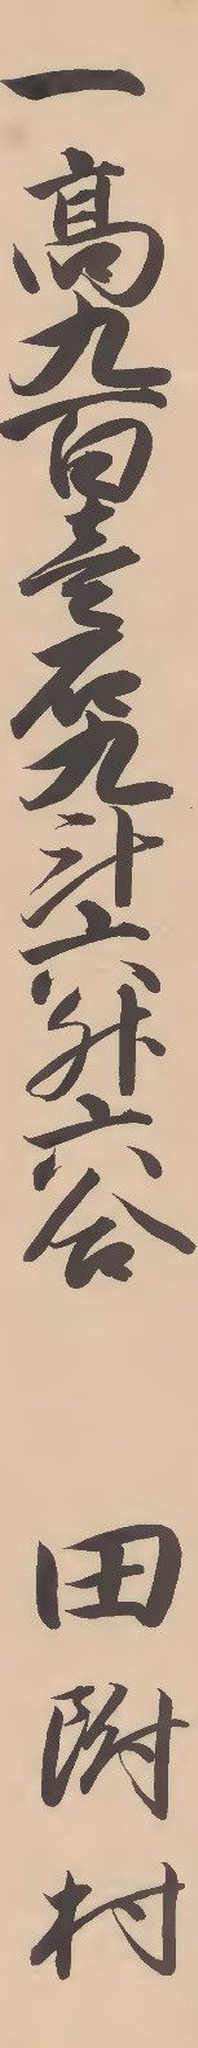一高九百壱石九斗六升六合田附村
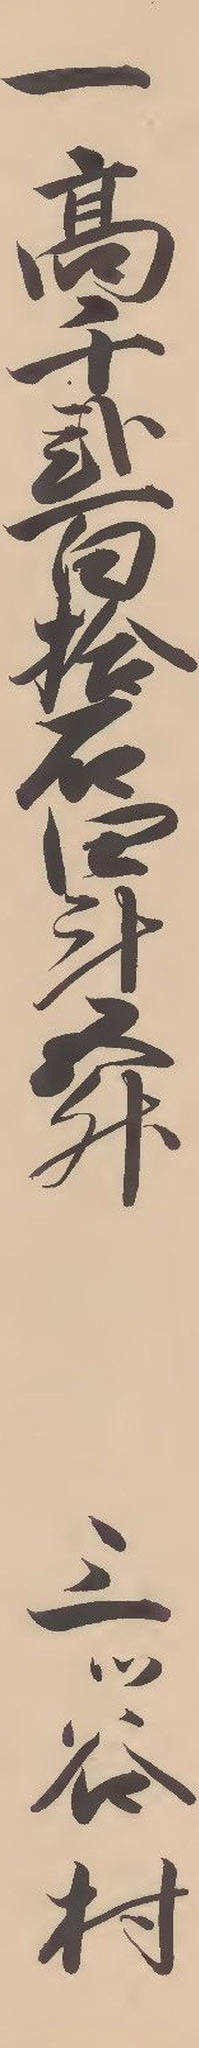一高千弐百拾石四斗五升三ツ谷村
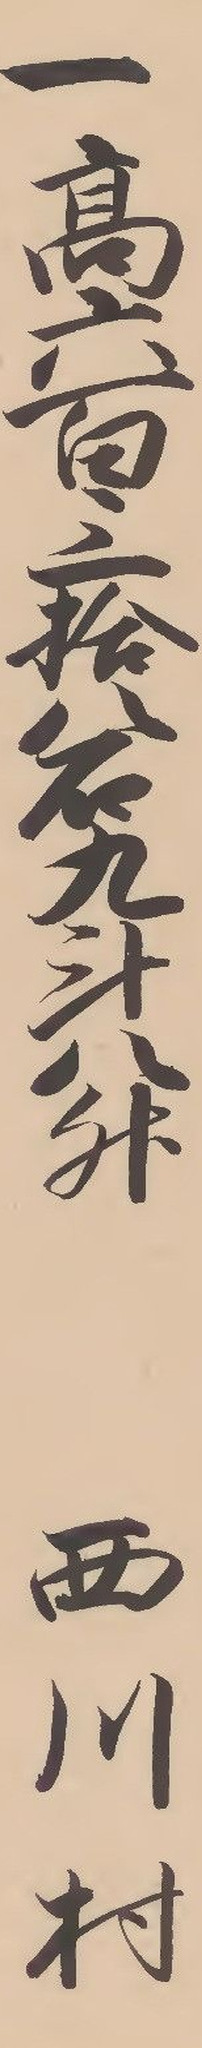一高六百三拾八石九斗八升西川村
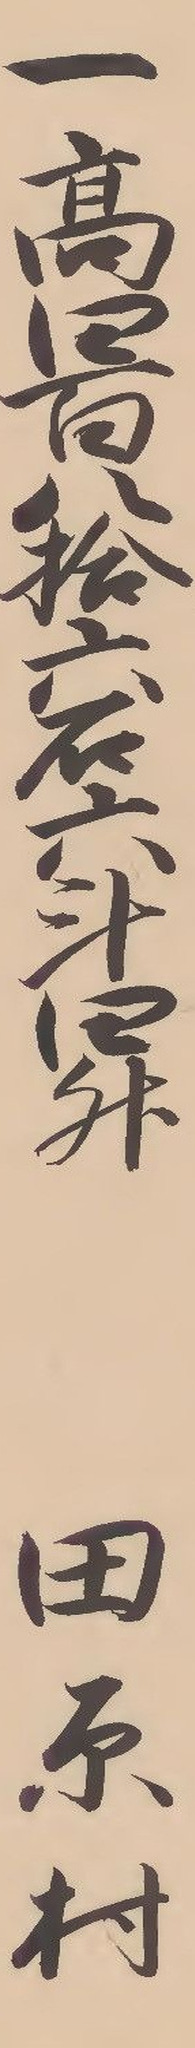一高四百八拾六石六斗四升田原村

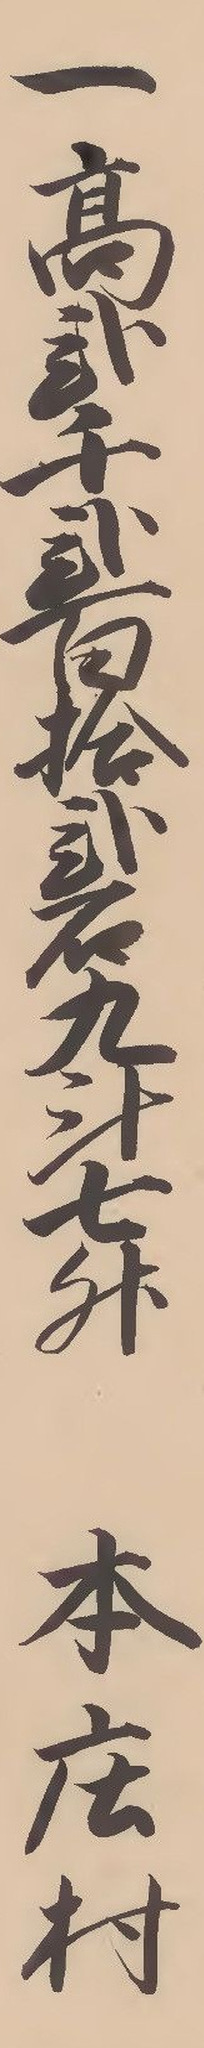一高弐千弐百拾弐石九斗七升本庄村
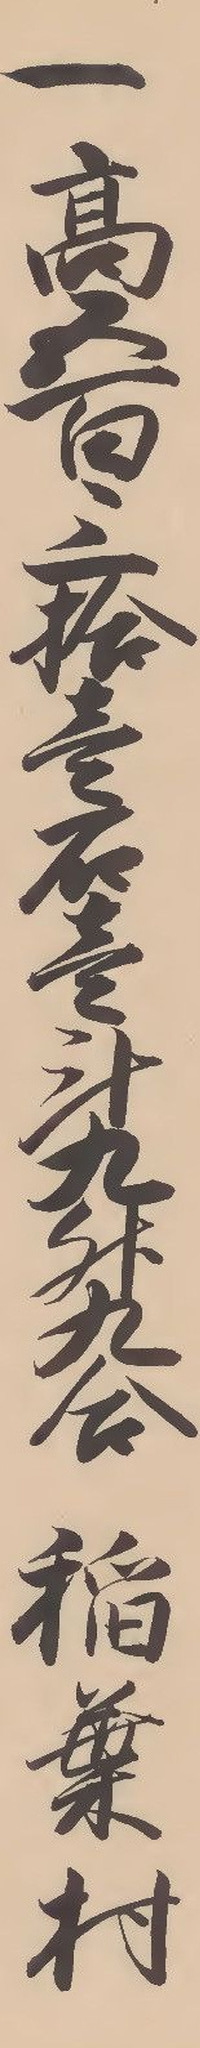一高五百三拾壱石壱斗九升九合稲葉村
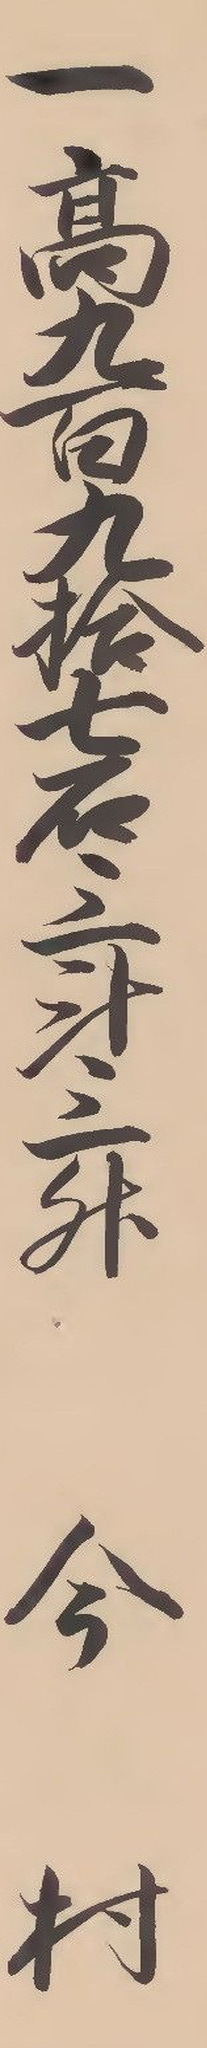一高九百九拾七石三斗三升今村
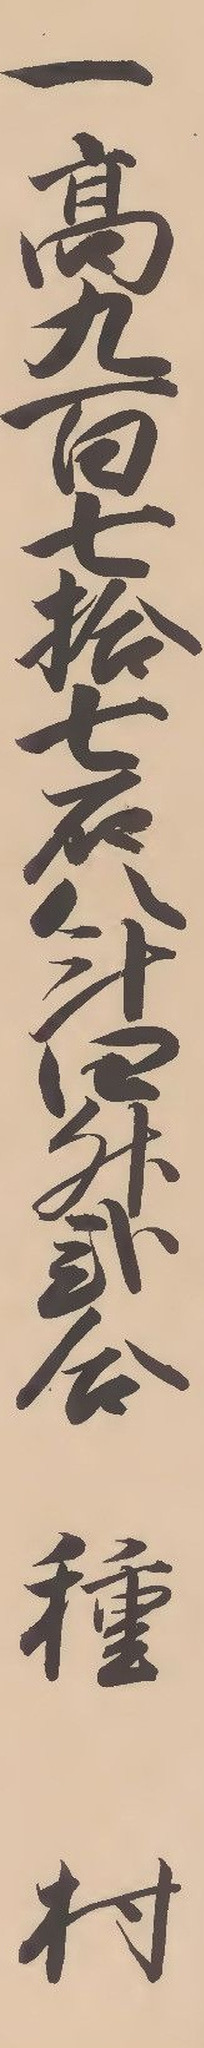一高九百七拾七石八斗四升弐合種村
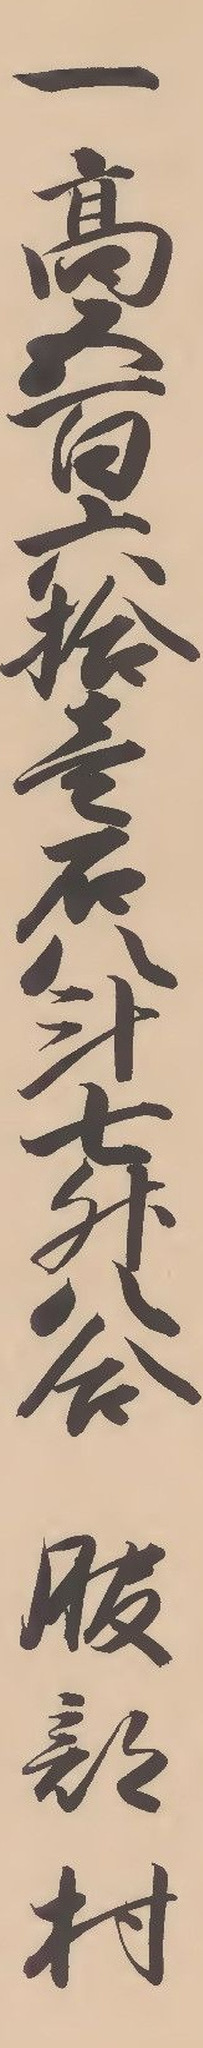一高五百六拾壱石八斗七升八合服部村
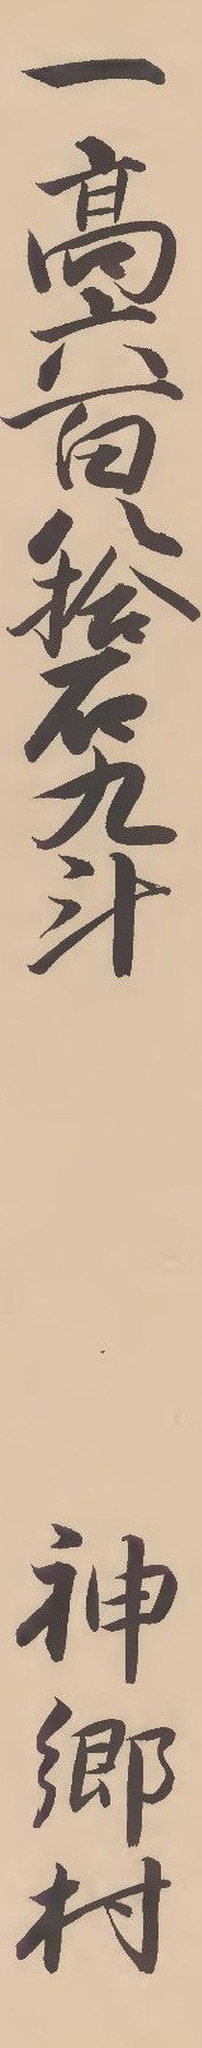一高六百八拾石九斗神郷村
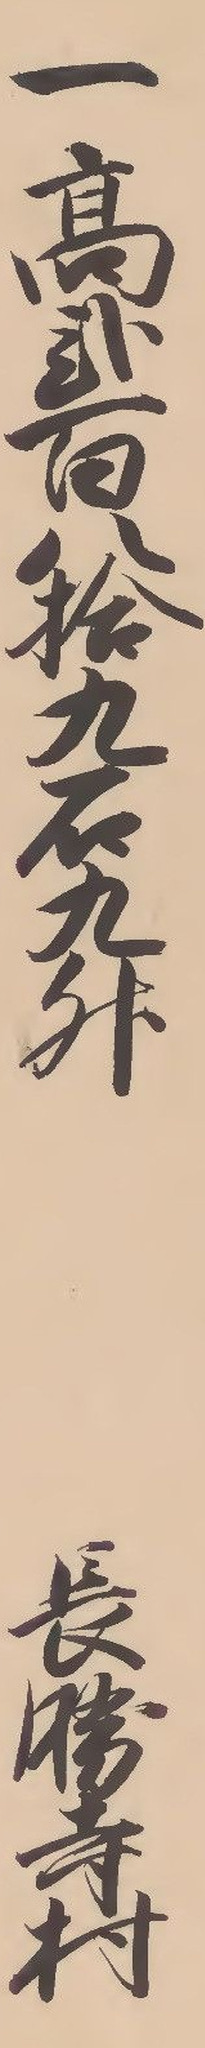一高弐百八拾九石九升長勝寺村

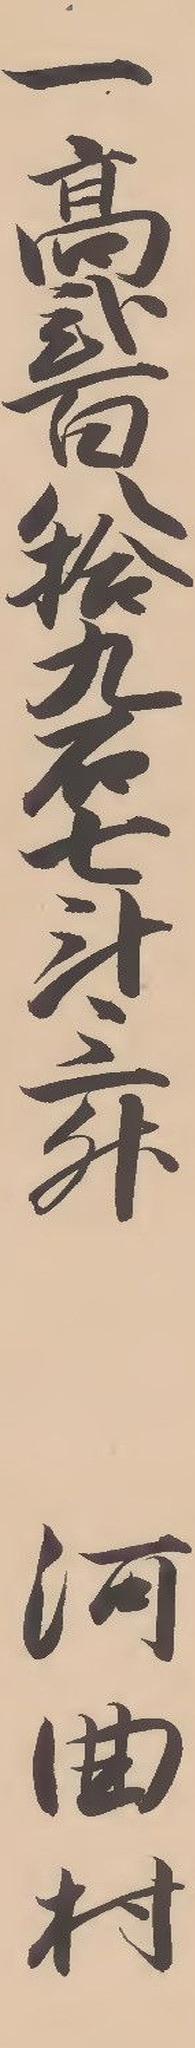一高弐百八拾九石七斗三升河曲村
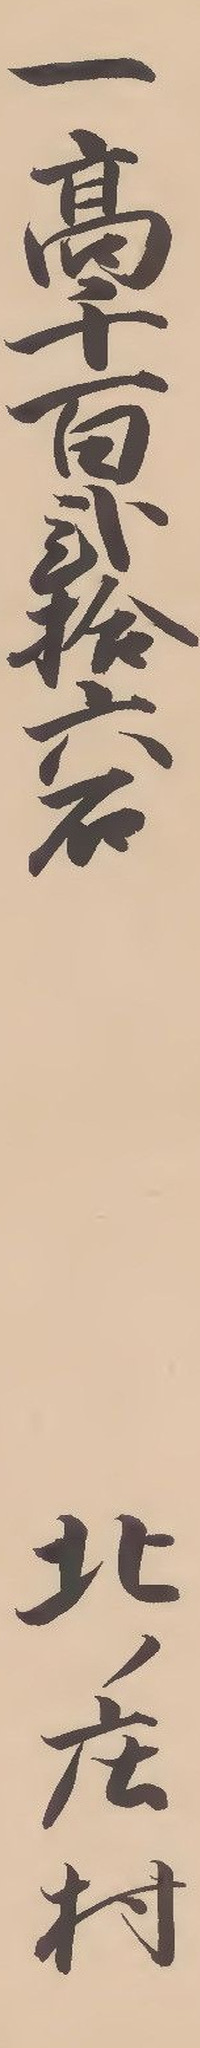一高千百弐拾六石北ノ庄村
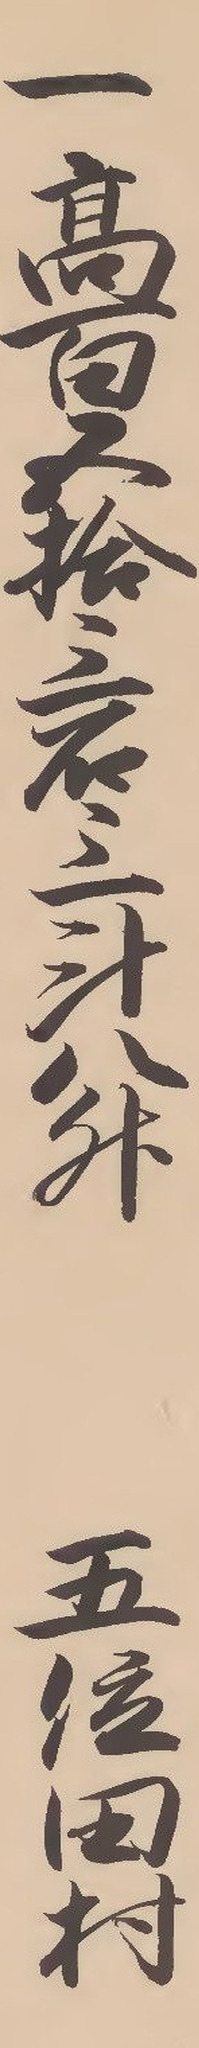一高百五拾三石三斗八升五位田村
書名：近江国郷帳
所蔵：国立公文書館 National Archives of Japan
